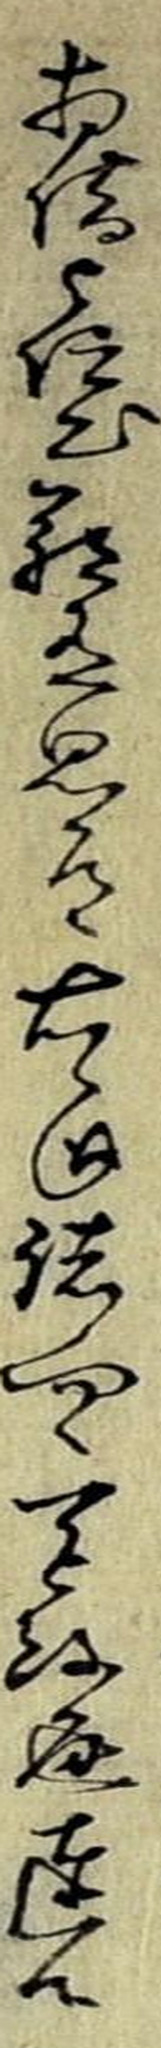拝借被仰出難有思召候右之趣諸向へ可被致通達候
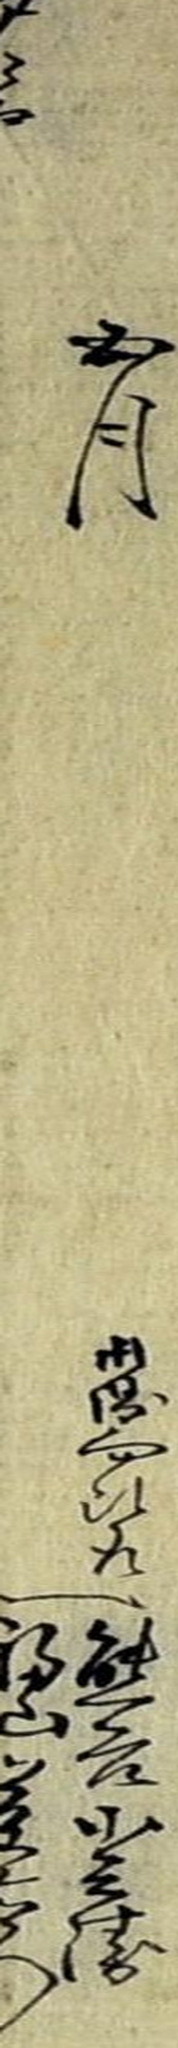五月御側向頭取熊谷小兵衛
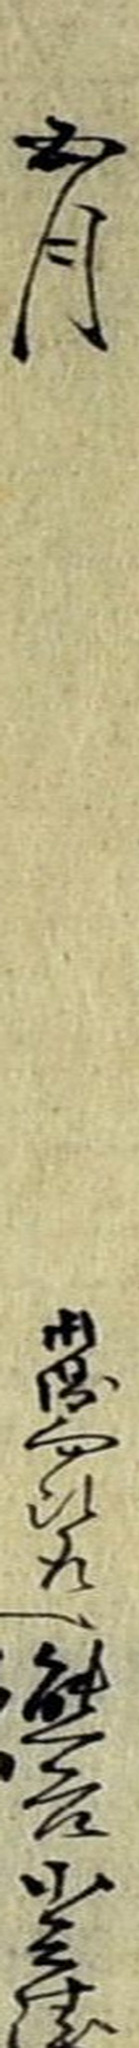五月御側向頭取熊谷小兵衛
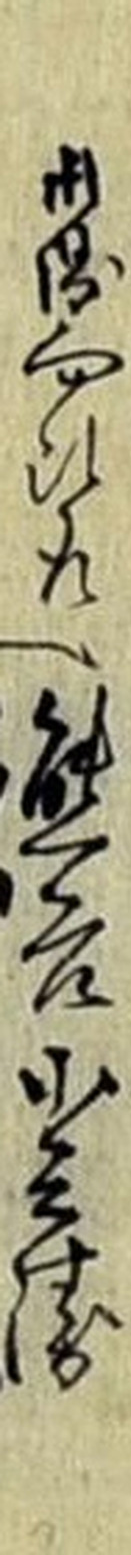五月御側向頭取熊谷小兵衛
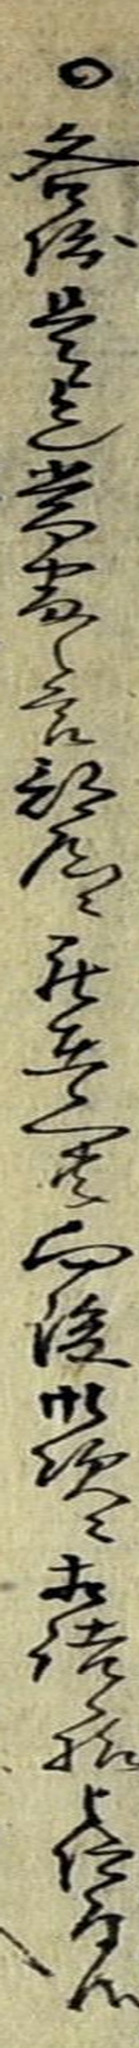○各儀是迄当番之節部屋ニ罷在候へ共向後御次ニ相詰候様被仰付候
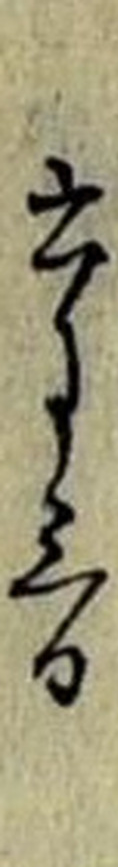六月三日
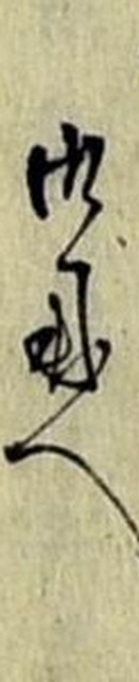御用人
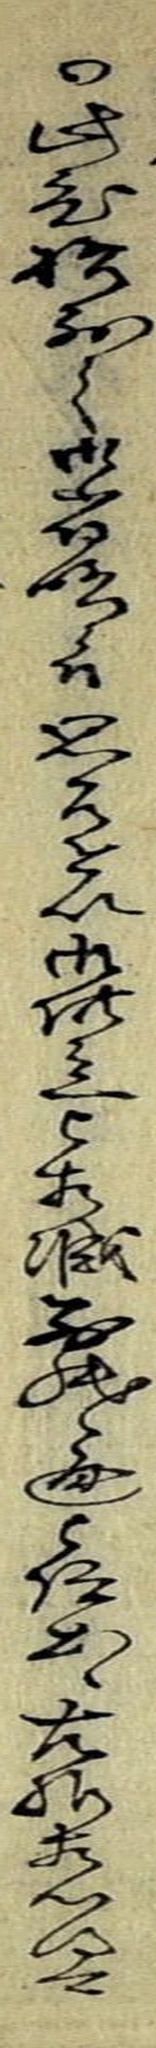○此度格別之御省略ニ付思召を以御供立被相減別紙之通被仰出候左様相心得可
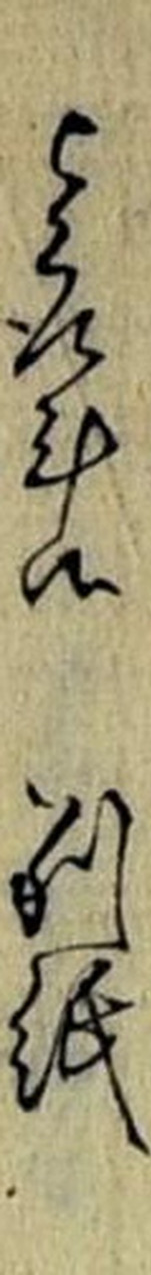被取計候別紙
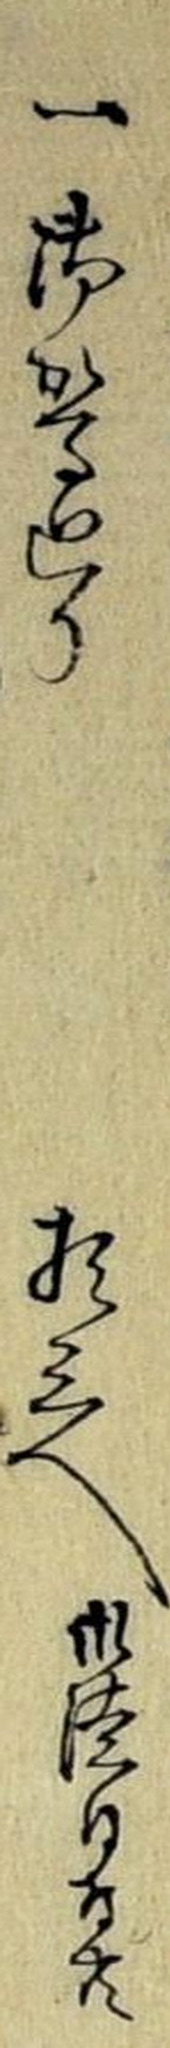一御駕廻り拾三人御徒目付共
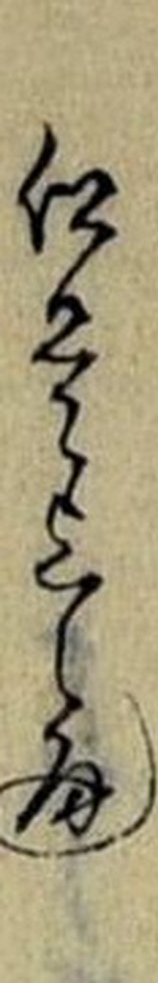但是迄之通
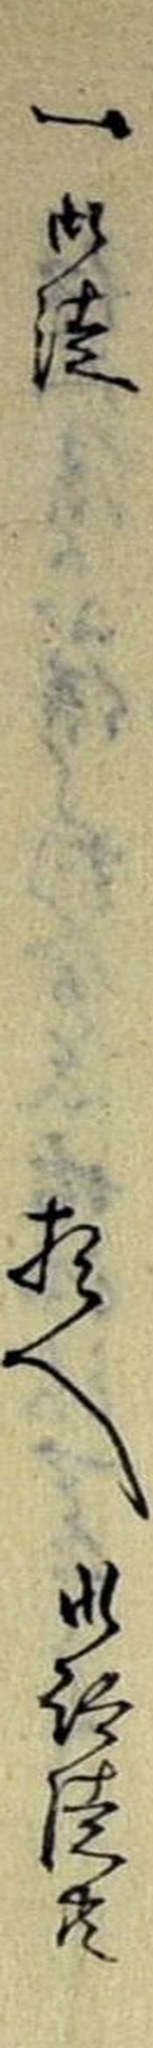一御徒拾人御跡徒共
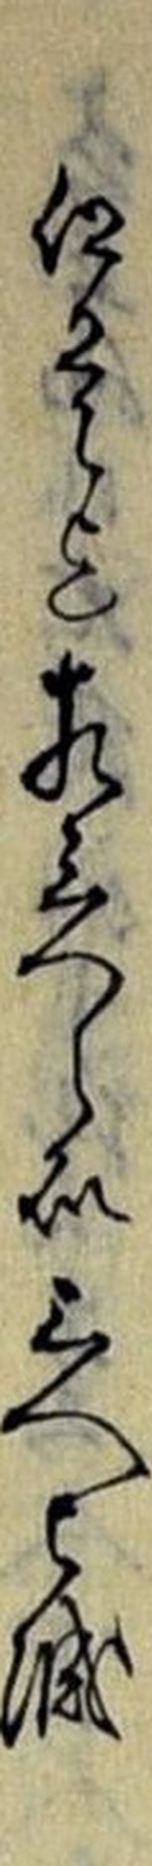但是迄拾三人之処三人被減
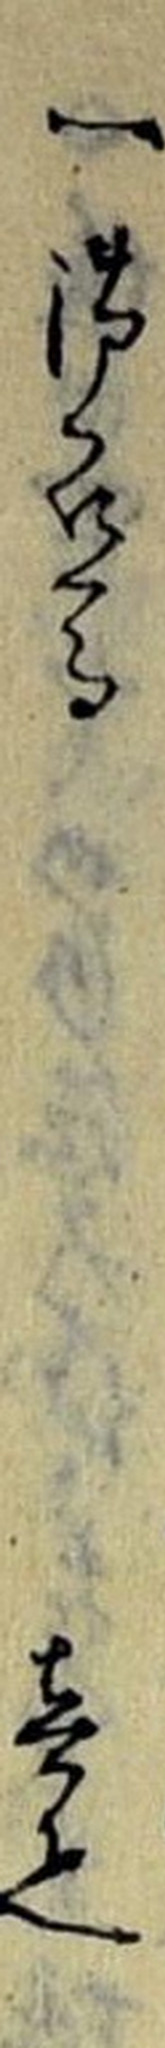一御召馬壱疋
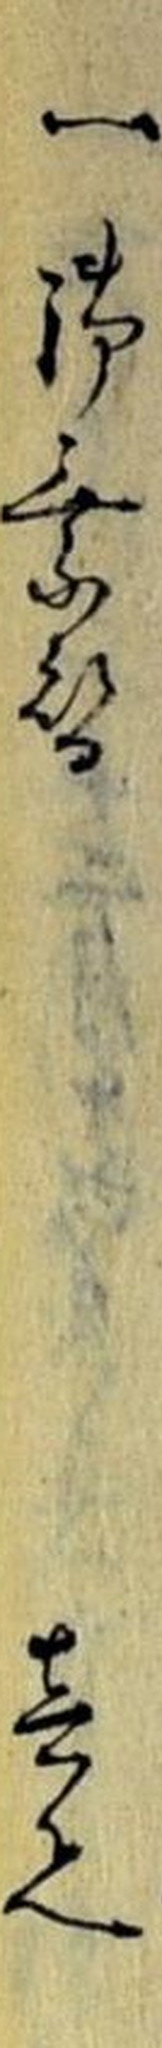一御乗替壱疋
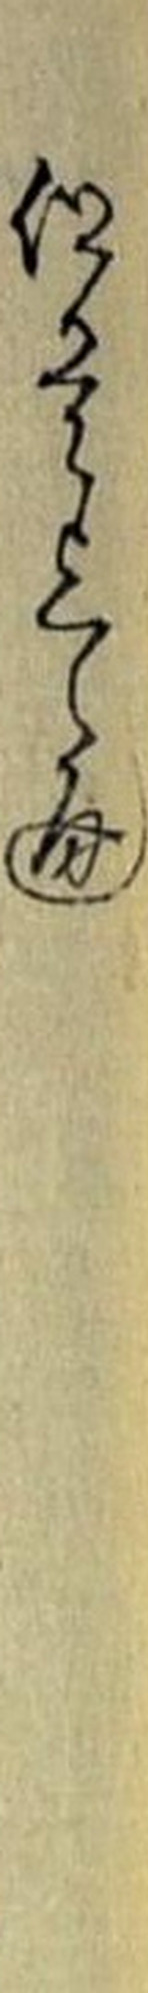但是迄之通
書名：命令之部 五
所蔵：福井県文書館 Fukui Prefectural Archives
